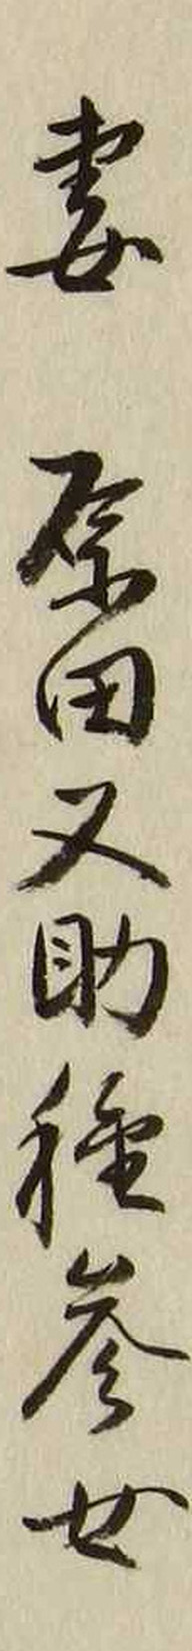妻原田又助種参女
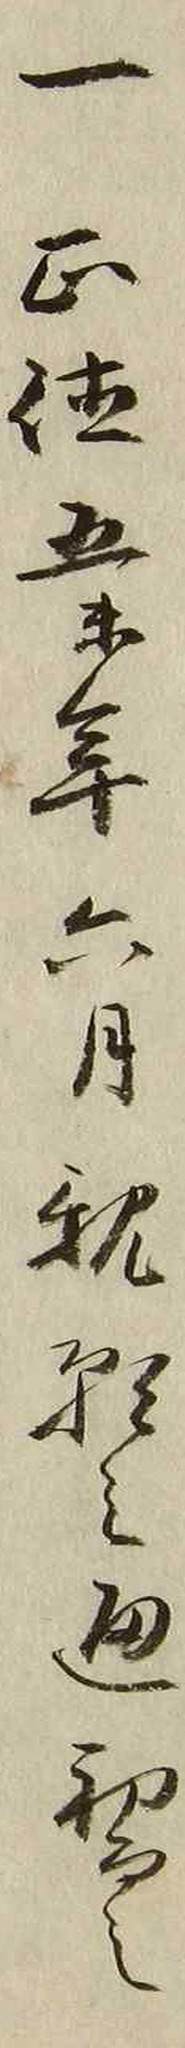一正徳五未年六月親願之通初而之
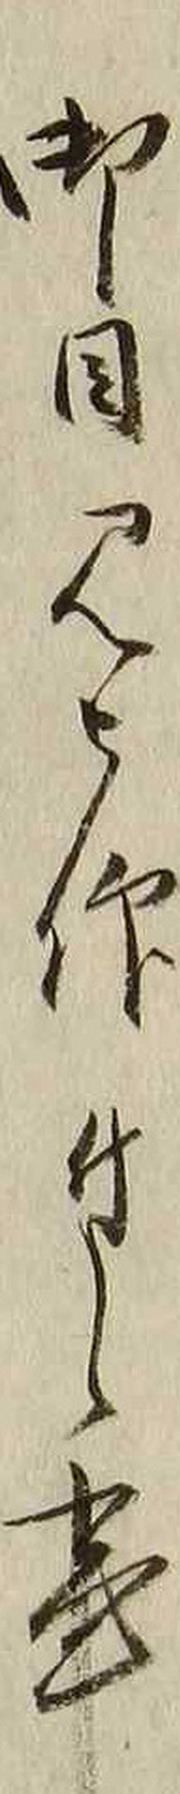御目見被仰付候事
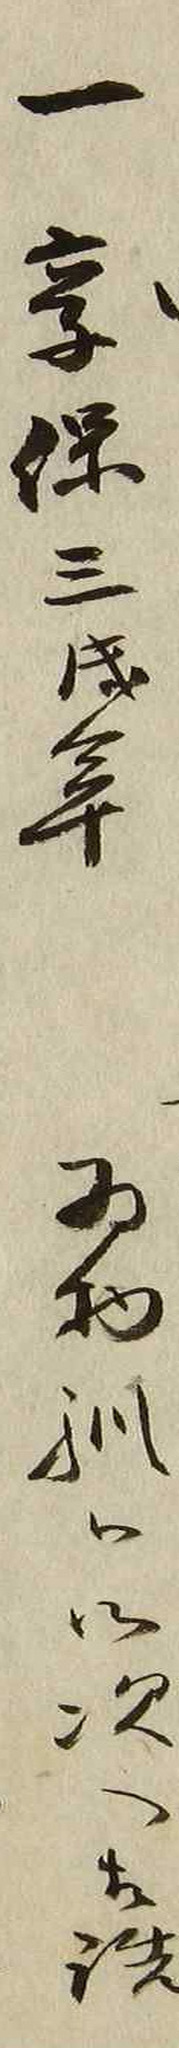一享保三戌年為物馴候御次へ相詰
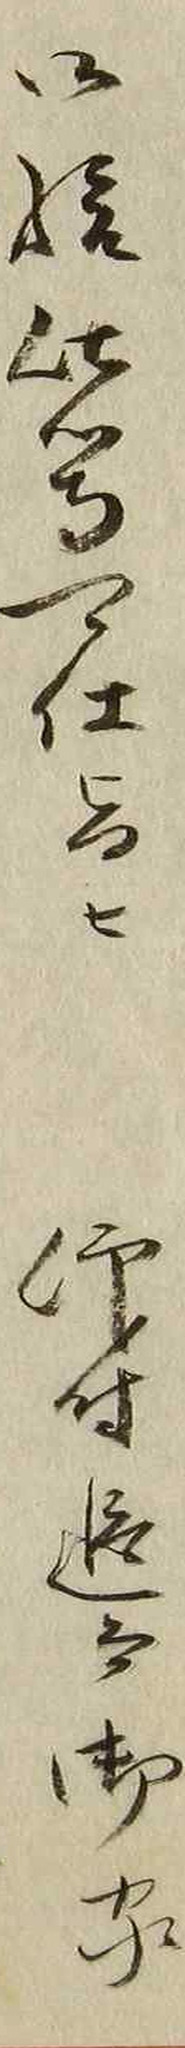御給仕等可仕旨被仰付追而御家
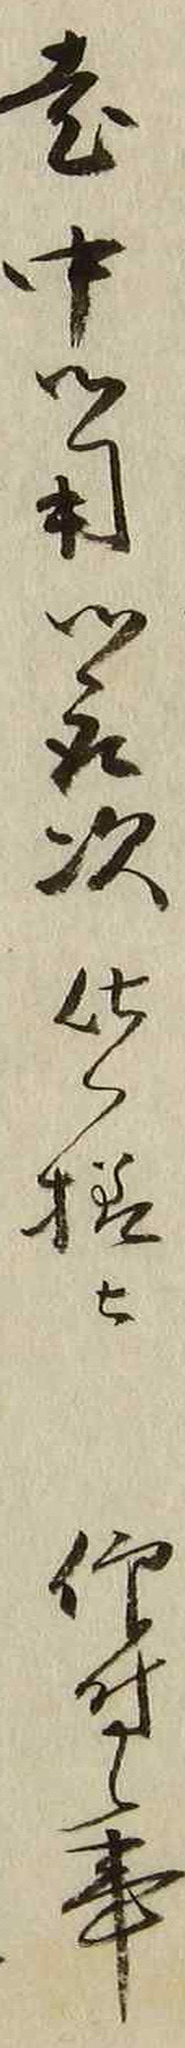老中御用御取次仕候様被仰付候事
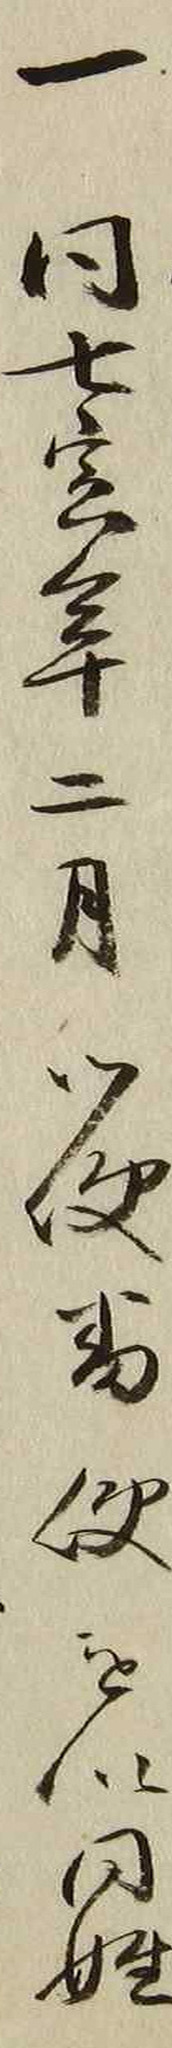一同七寅年二月御使番使を以同姓
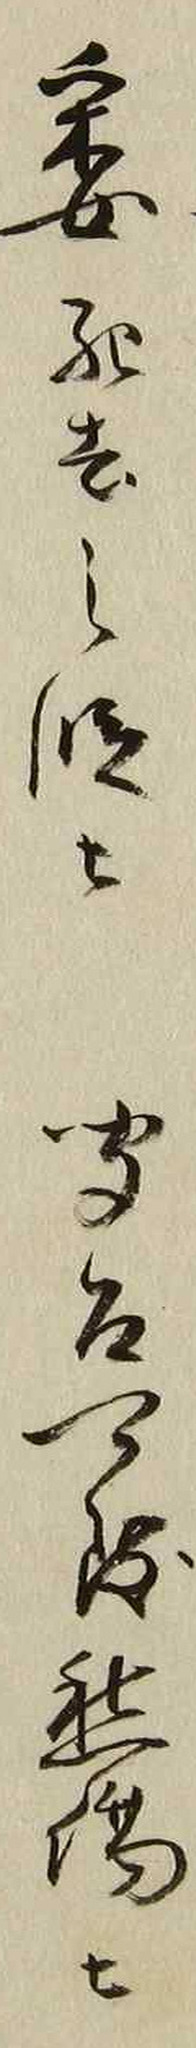采女死去之段被聞召可致愁傷被
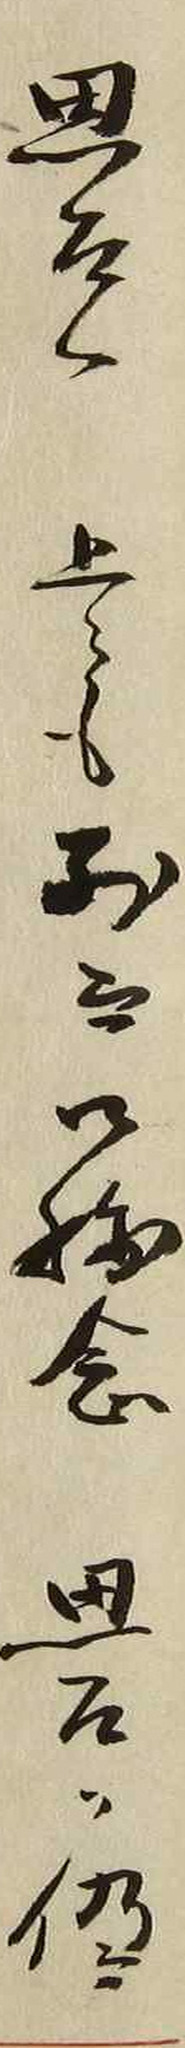思召候上にも別而御残念思召候仍而
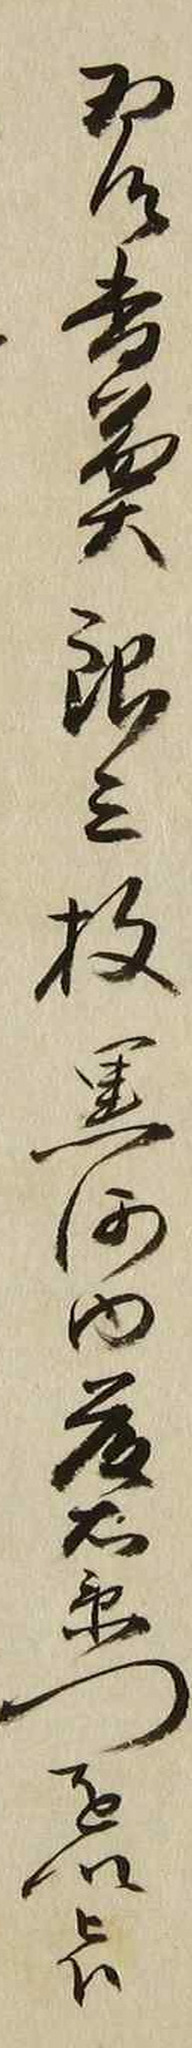為御香典銀三枚黒河内藤右衛門を以被下
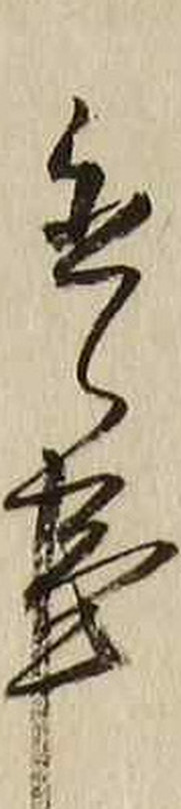置候事
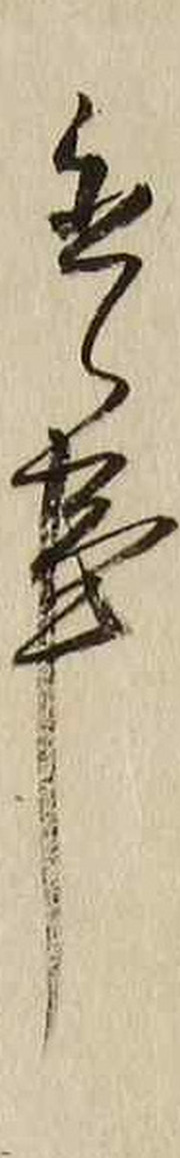置候事
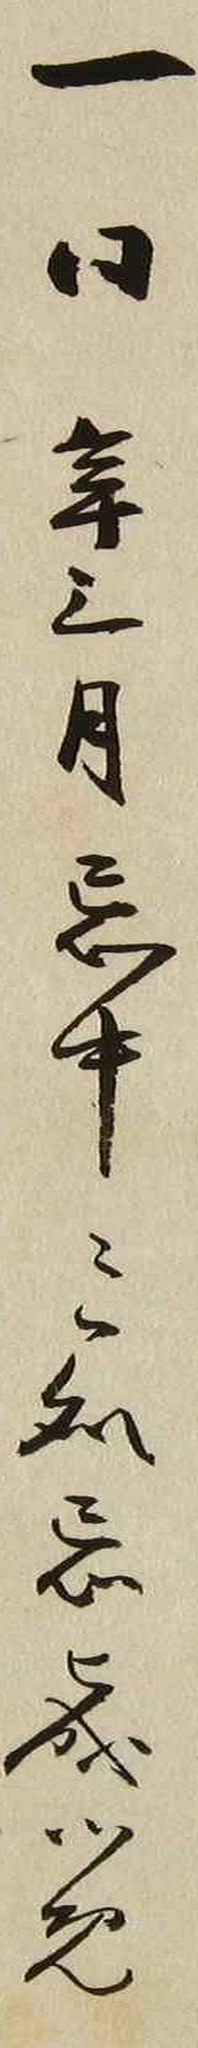一同年三月忌中に候処忌被成御免
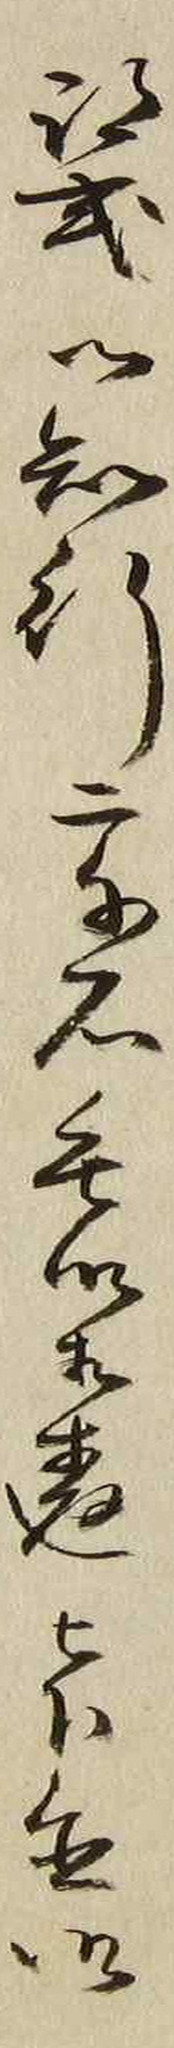跡式御知行二千石無御相違被下置御
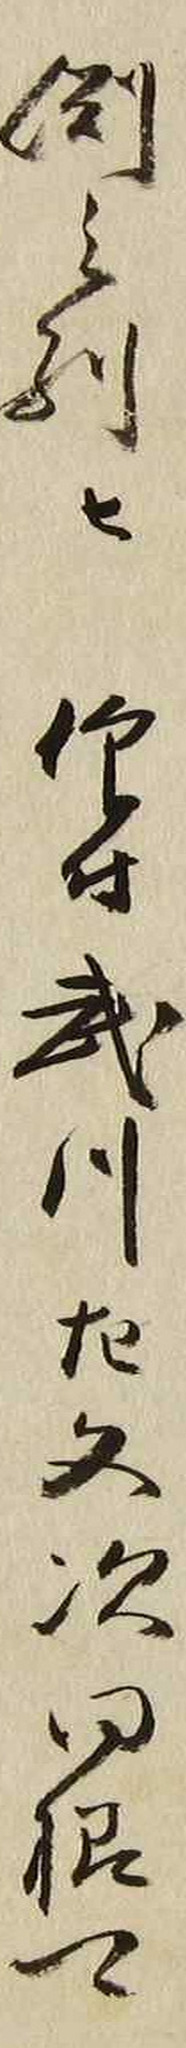側之列被仰付武川左文次同様可
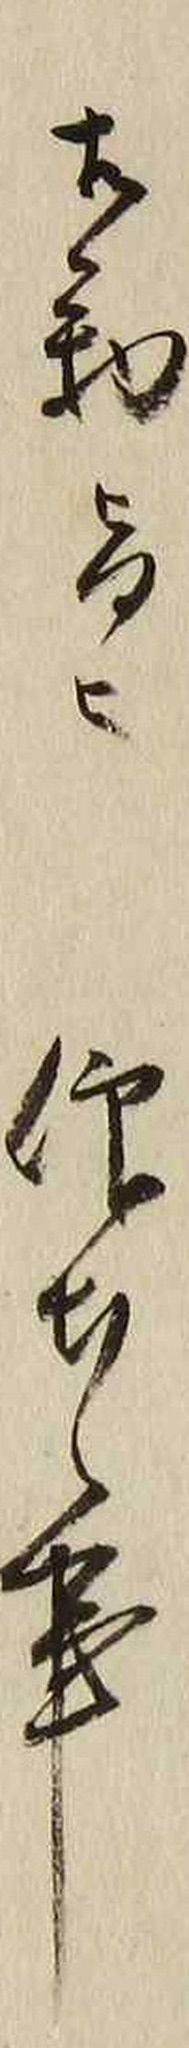相勤旨被仰出候事
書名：諸士系譜　巻之292　き之部1
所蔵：会津若松市立会津図書館
